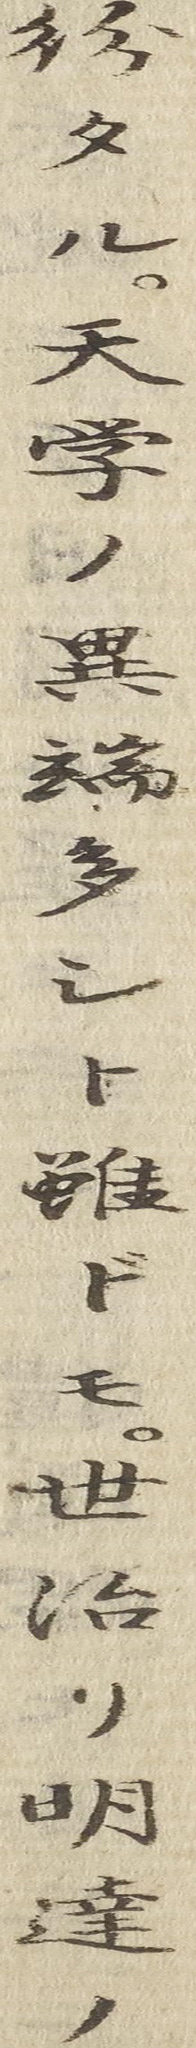紛タル。天学ノ異端多シと雖ドモ。世治リ明達ノ
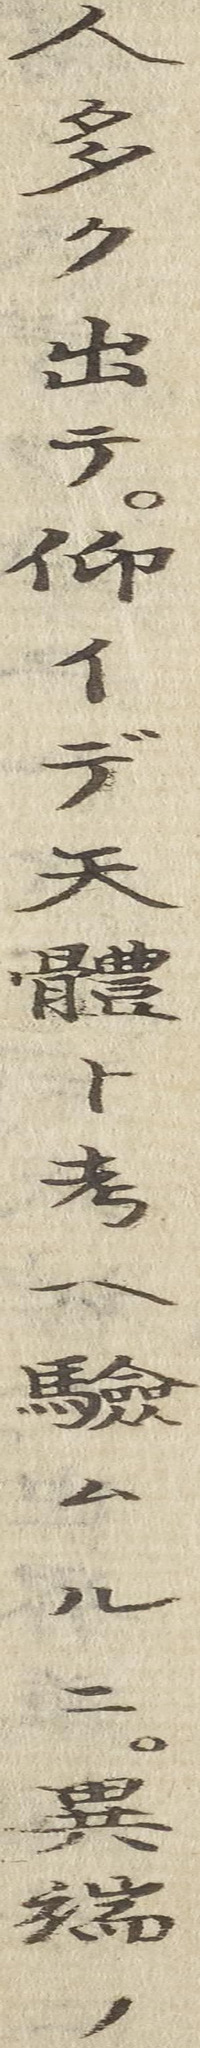人多ク出テ。仰イデ天体ト考ヘ験ムルニ。異端ノ
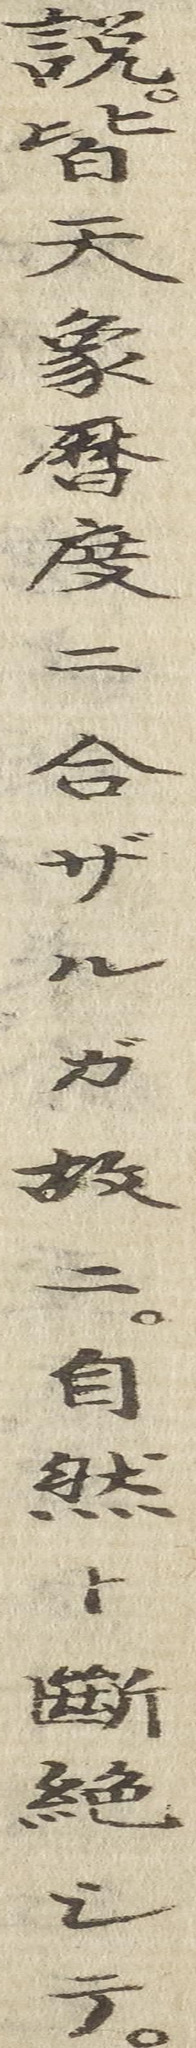説。皆天象暦度ニ合ザルガ故ニ。自然ト断絶シテ。
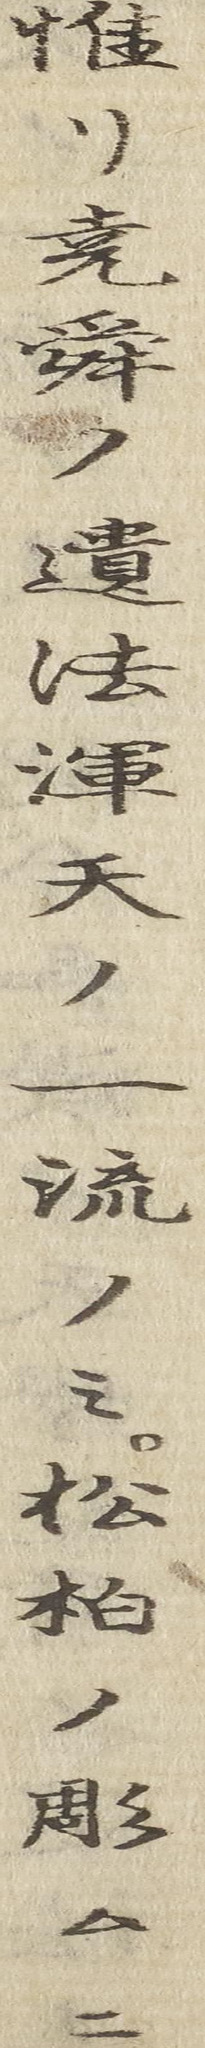惟リ尭舜ノ遺法渾天ノ一流ノミ。松柏ノ彫ムニ
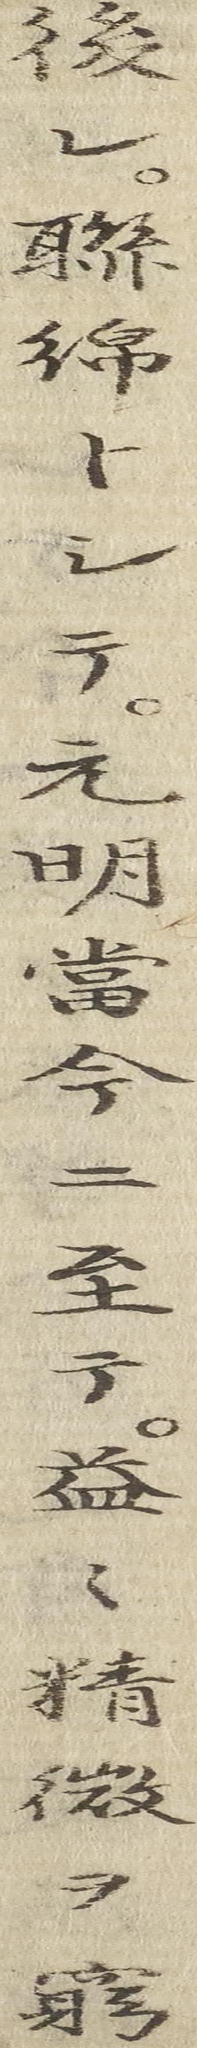後レ。聯綿トシテ。元明当今ニ至テ。益々精微ヲ窮

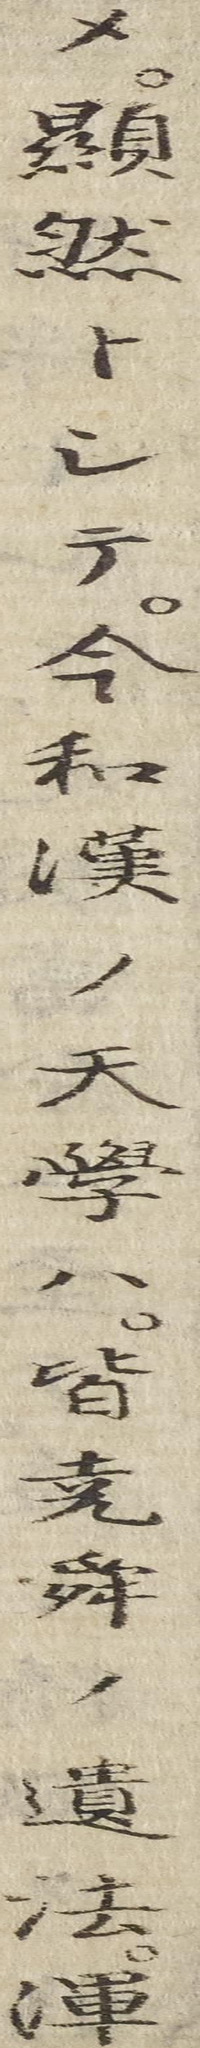メ。顕然トシテ。今和漢ノ天学ハ。皆堯舜ノ遺法。渾
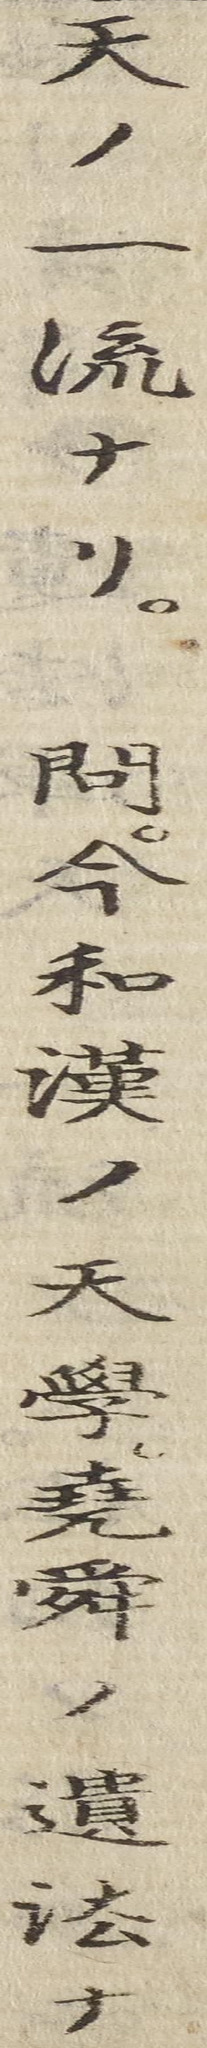天ノ一流ナリ。問。今和漢ノ天学。堯舜ノ遺法ナ
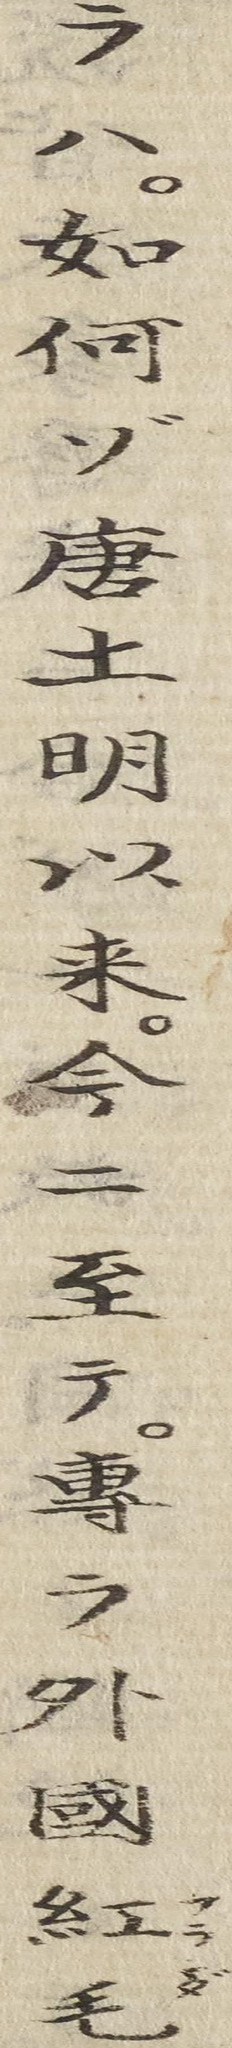ラハ。如何ゾ唐土明以来。今ニ至テ。専ラ外国紅毛
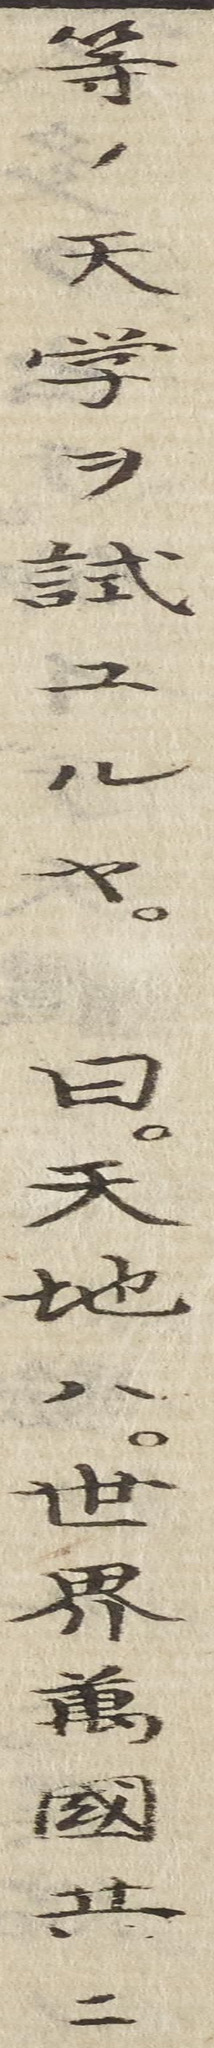等ノ天学ヲ試ユルヤ。曰。天地ハ。世界万国共ニ
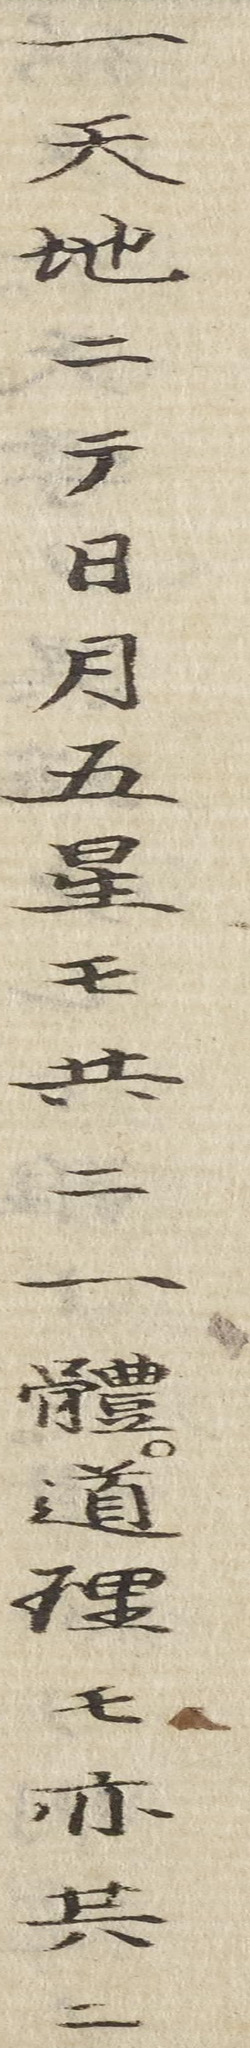一天地ニテ日月五星モ共ニ一体。道理モ亦共ニ
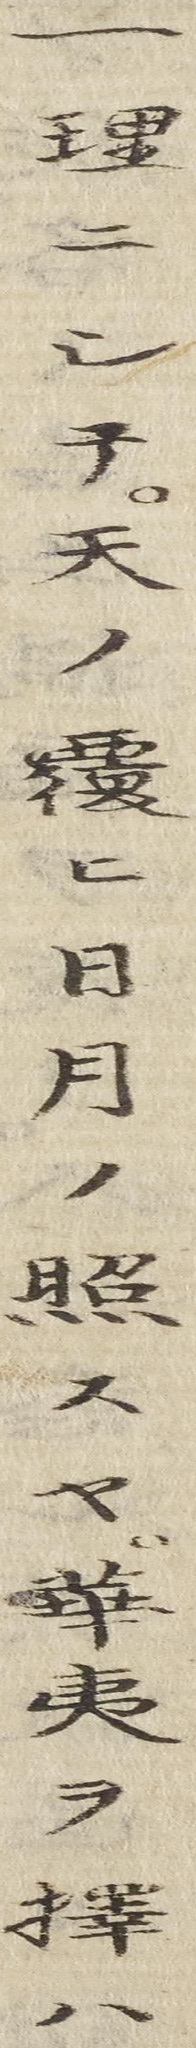一理ニシテ。天ノ覆ヒ日月ノ照スヤ。華夷ヲ択ハ
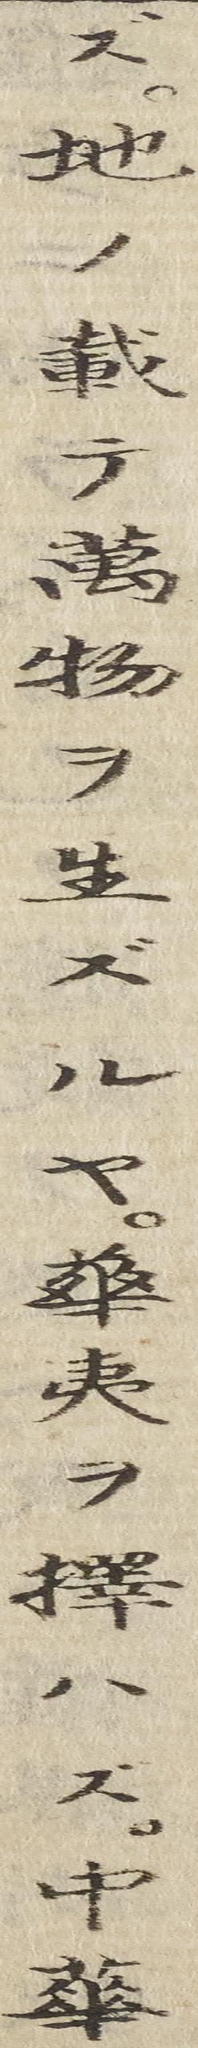ズ。地ノ載テ万物ヲ生ズルヤ。華夷ヲ択ハズ。中華
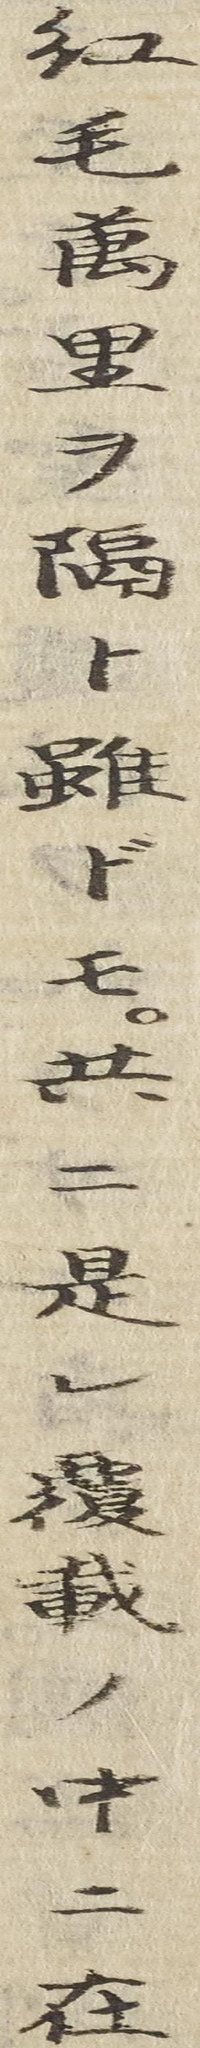紅毛万里ヲ隔ト雖ドモ。共ニ是レ覆載ノ中ニ在
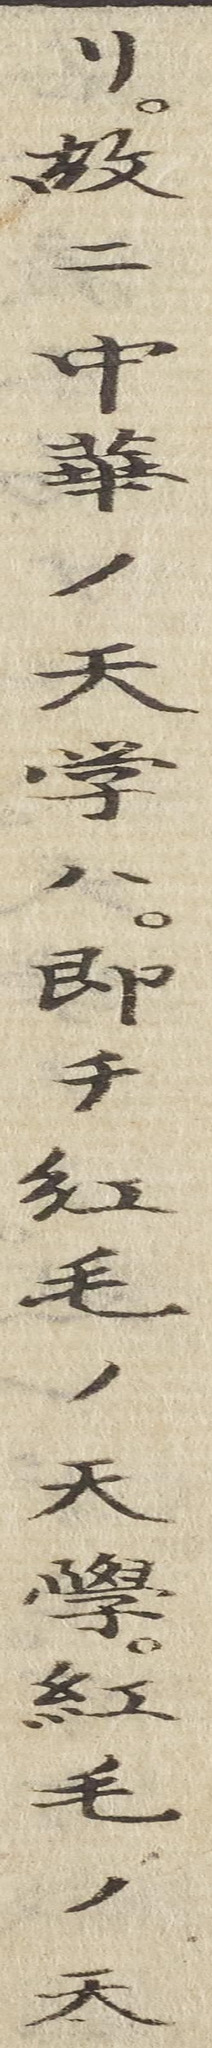リ。故ニ中華ノ天学ハ。即チ紅毛ノ天学。紅毛ノ天
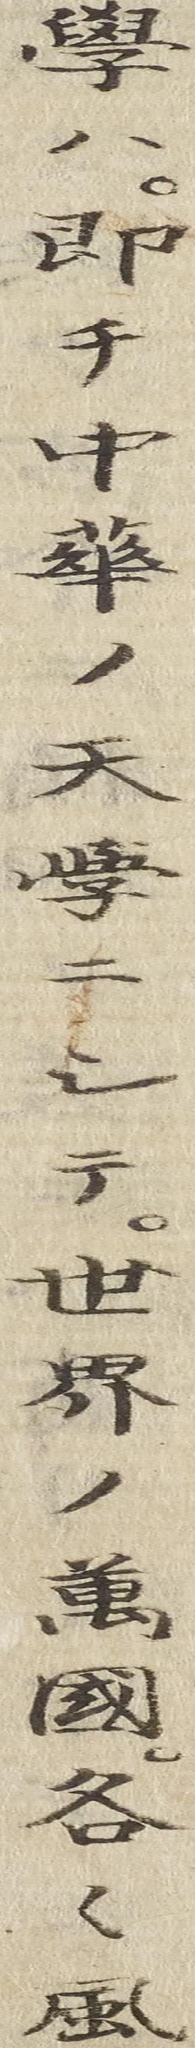学ハ。即チ中華ノ天学ニシテ世界ノ万国。各々風
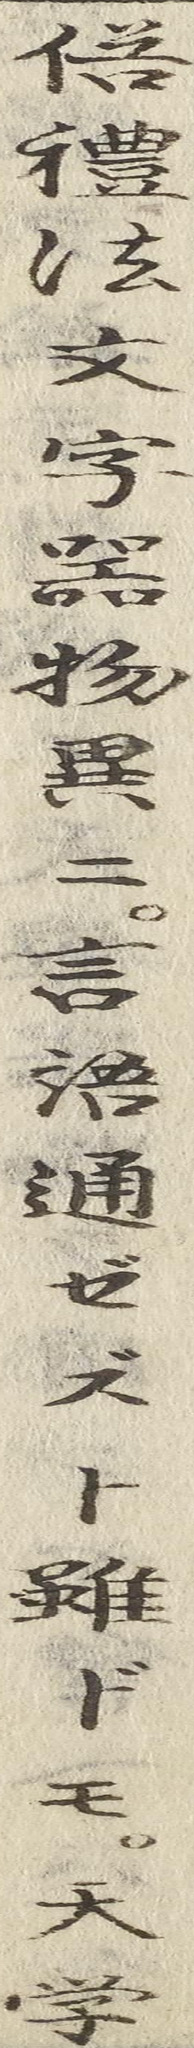俗礼法文字器物異ニ。言語通ゼズト雖ドモ。天学
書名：大略天学名目鈔　天經或問附録
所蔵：東京大学地震研究所図書室 Earthquake Research Institute Library, The University of Tokyo, JAPAN
